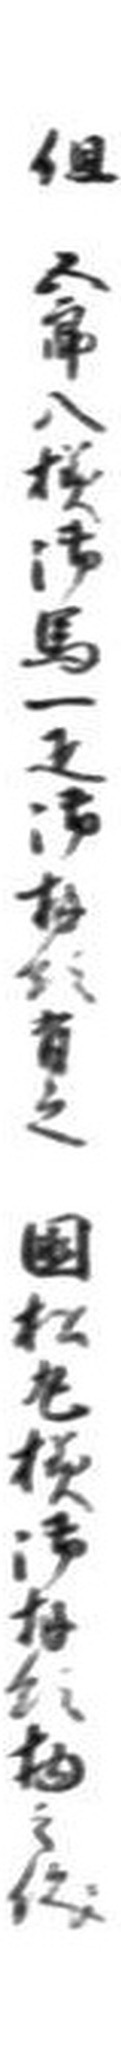但五郎八様御馬一疋御拝領有之国松丸様御拝領物之儀
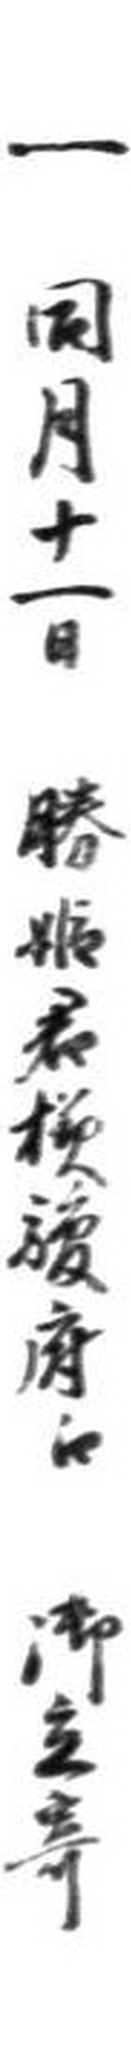一同月十一日勝姫君様駿府江御立寄
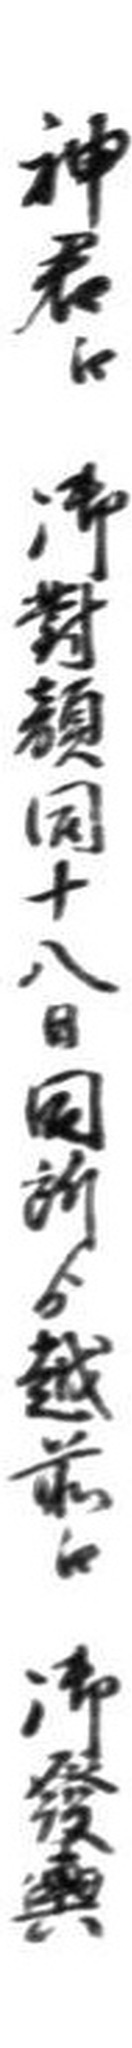神君江御対顔同十八日同所ゟ越前江御発輿

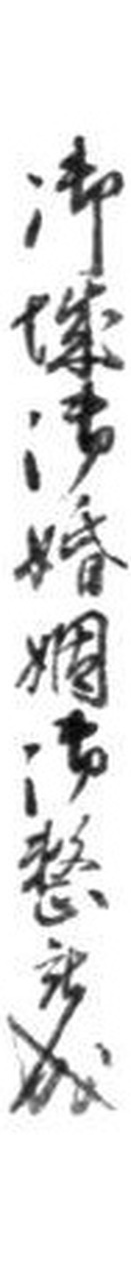御城御婚姻御整被成
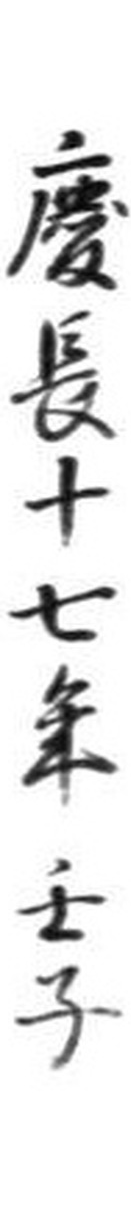慶長十七年壬子
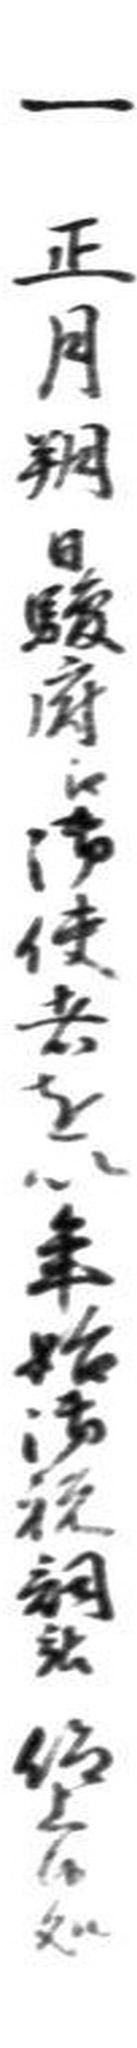一正月朔日駿府江御使者を以年始御祝詞被仰上候処
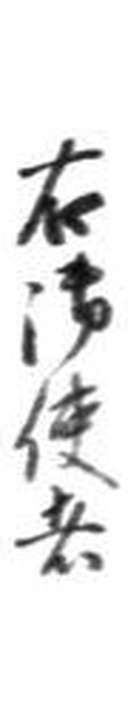右御使者
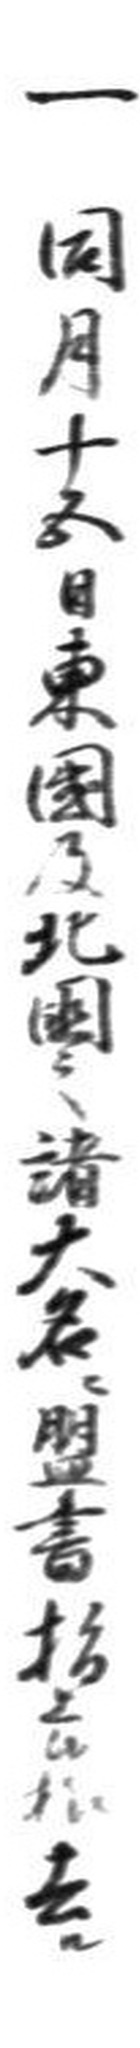一同月十五日東国及北国之諸大名ニ盟書指上候様去ル
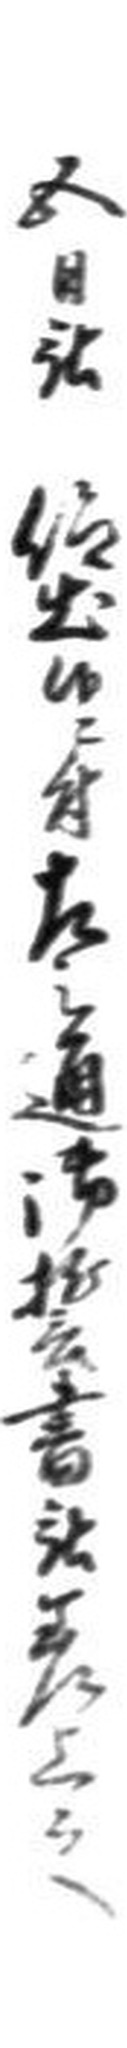五日被仰出候ニ付左之通御誓書被差上之
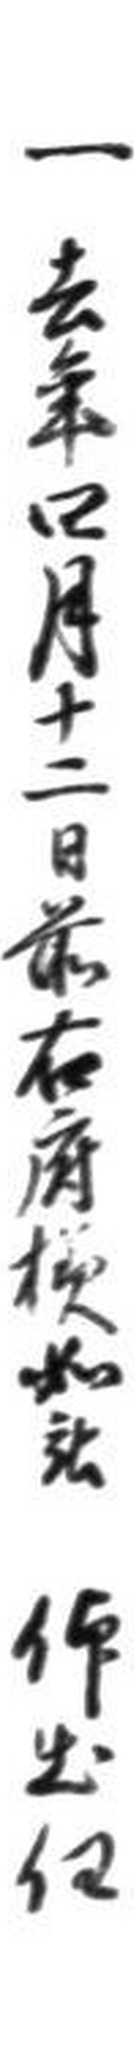一去年四月十二日前右府様如被仰出任

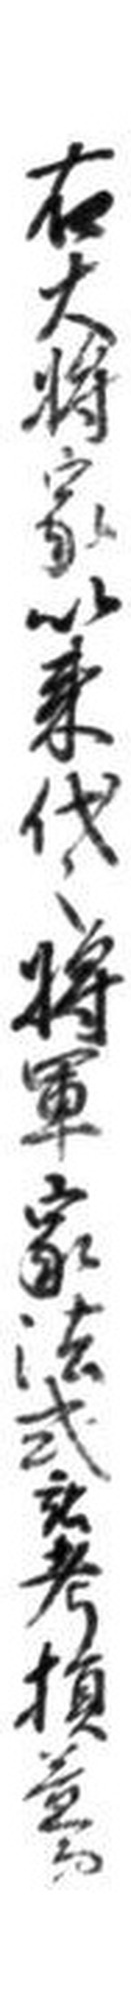右大将家以来代々将軍家法式被考損益而
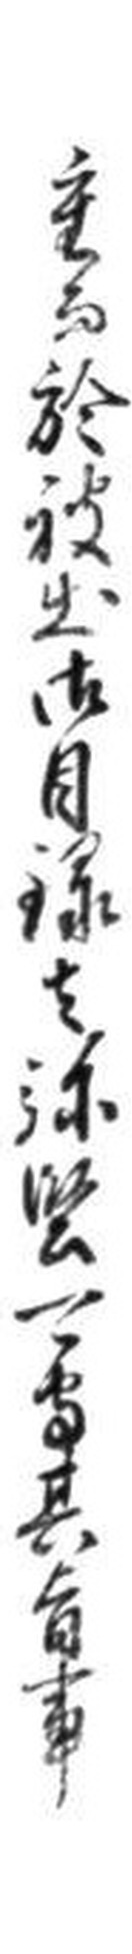重而於被出御目録者弥堅可守其旨事
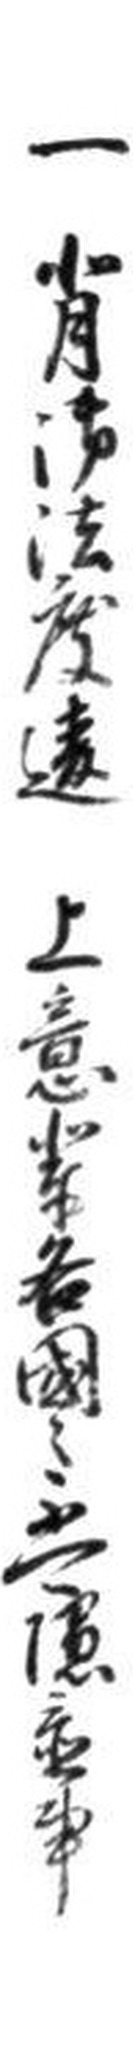一背御法度違上意輩各国々不可隠置事
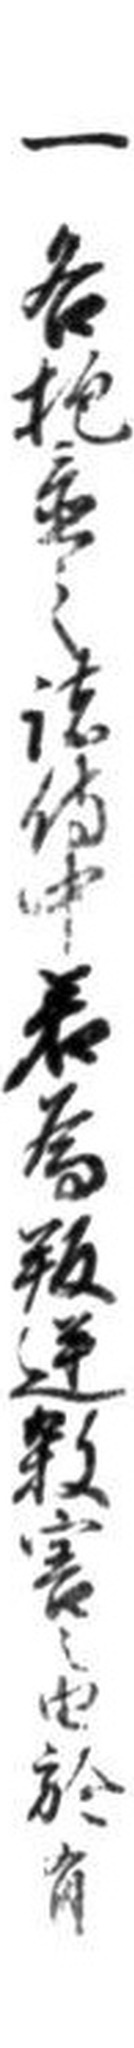一各抱置之諸侍中若為叛逆殺害之由於有
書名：家譜 二 忠直公 従文禄四年到慶安四年
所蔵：福井県文書館 Fukui Prefectural Archives
